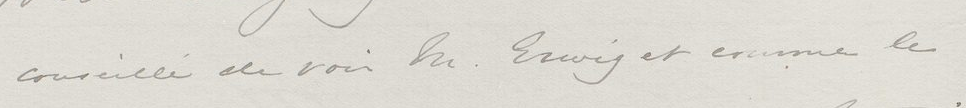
conseillé de voir M. Erwig et comme le
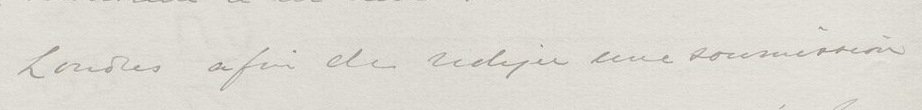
Londres afin de rediger une soumission
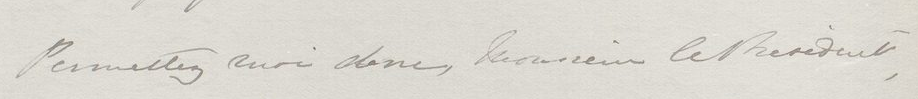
Permettez moi donc, Monsieur le President,
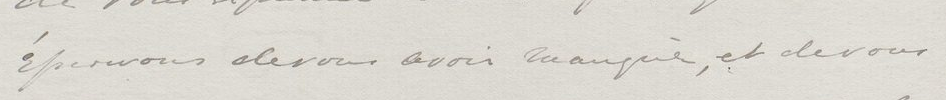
Éprouvons de vous avoir manquè, et de vous
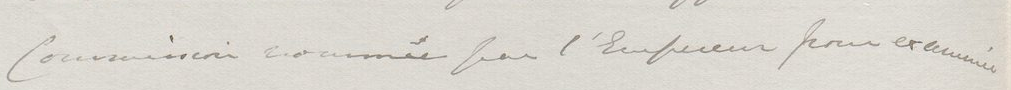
Commission nommée par l'Empereur pour examiner
